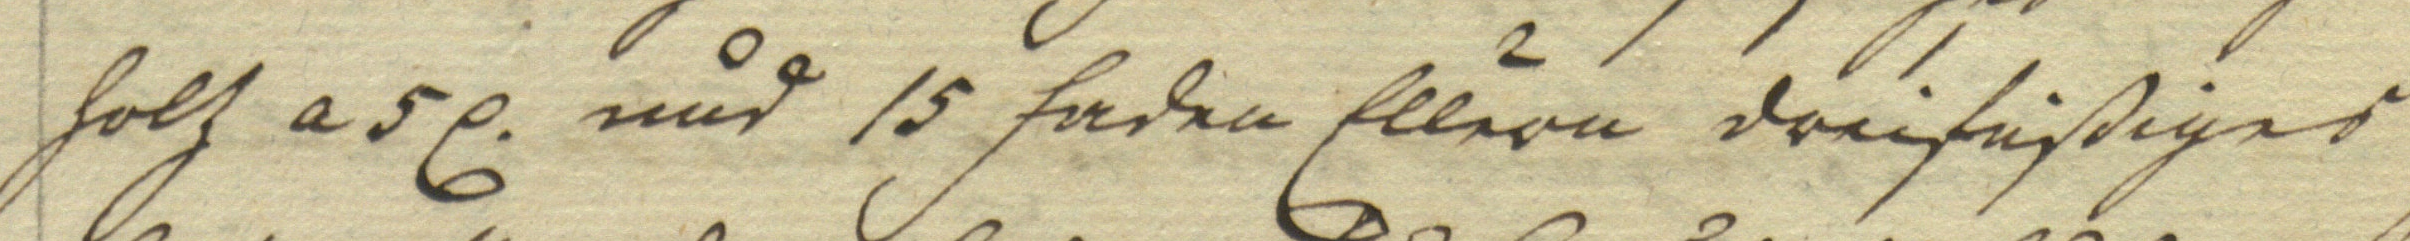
Holz a 5 l. und 15 Faden Ellern dreifüßiges
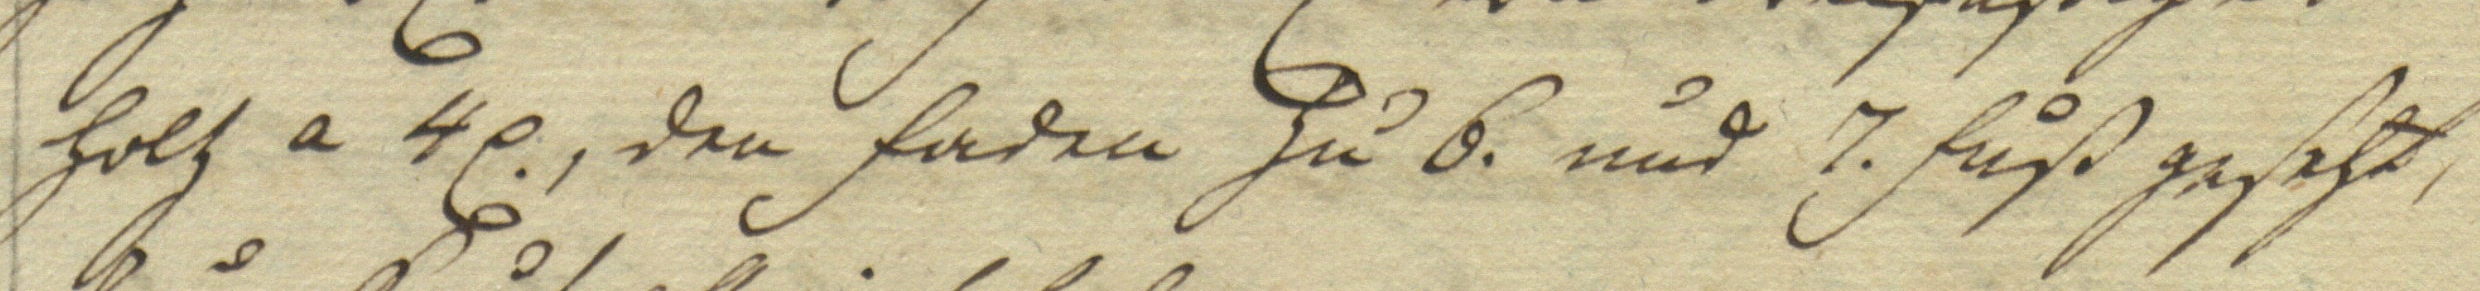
Holz a 4 l., den Faden zu 6. und 7. Fuß gesetzt,
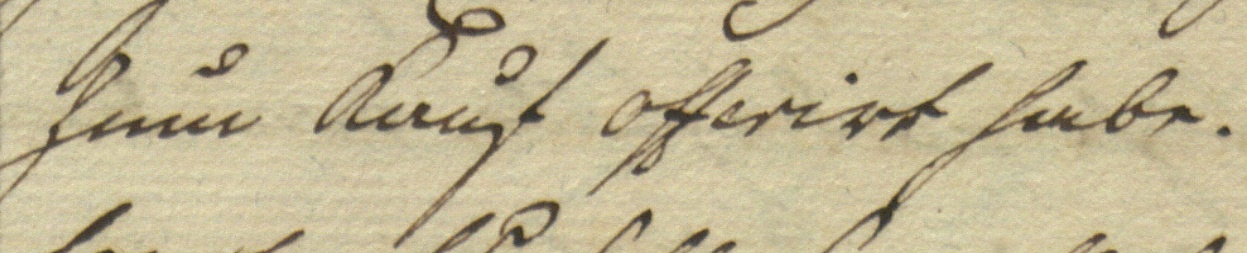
zum Kauf offerirt habe.
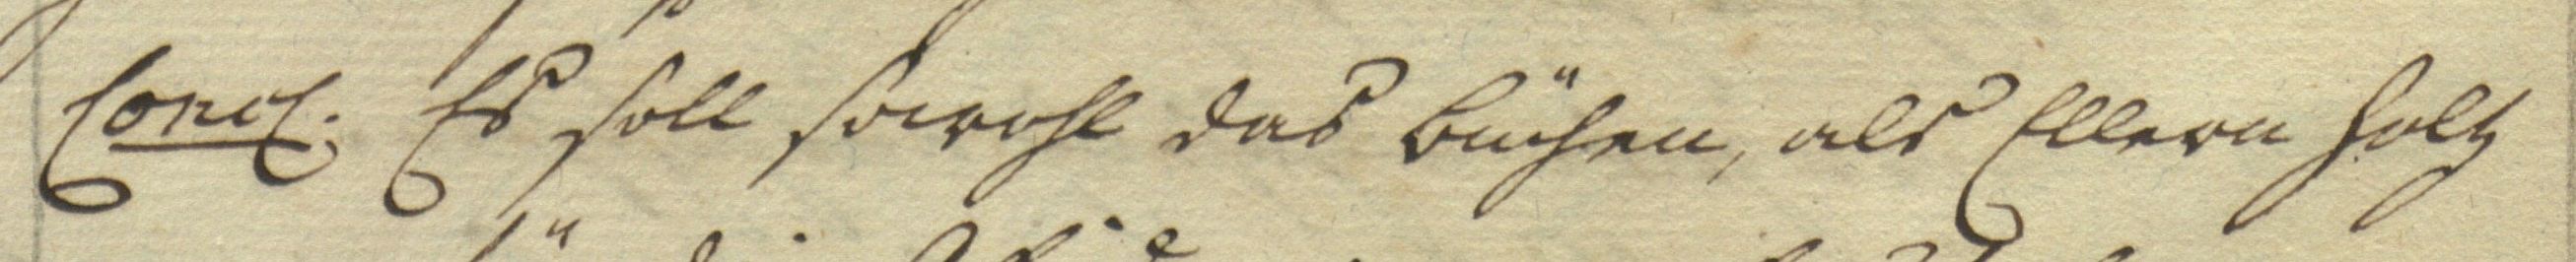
Concl. Es soll sowohl das Büchen, als Ellern Holz
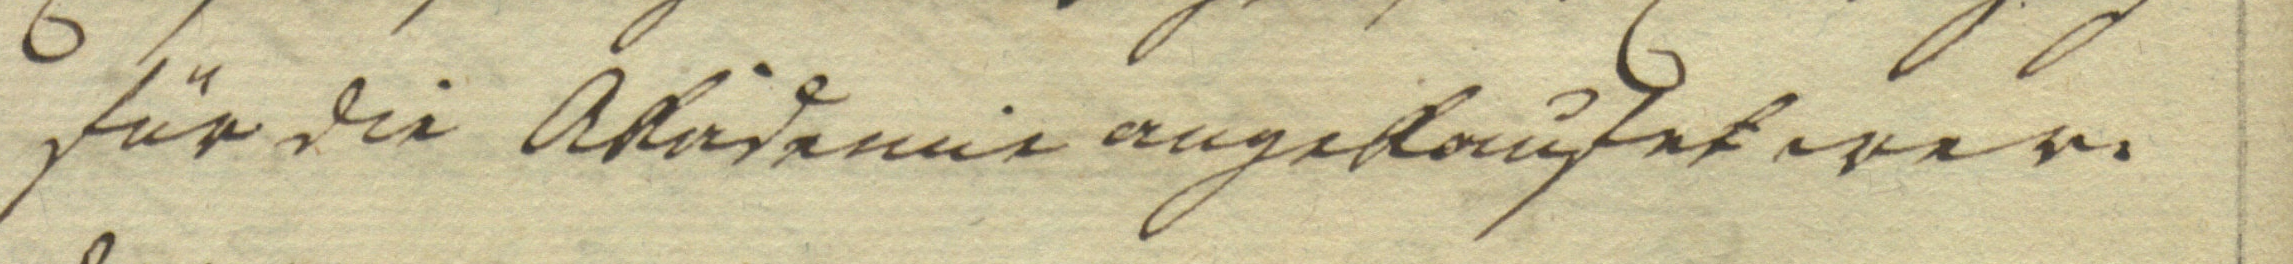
für die Akademie angekaufet wer¬
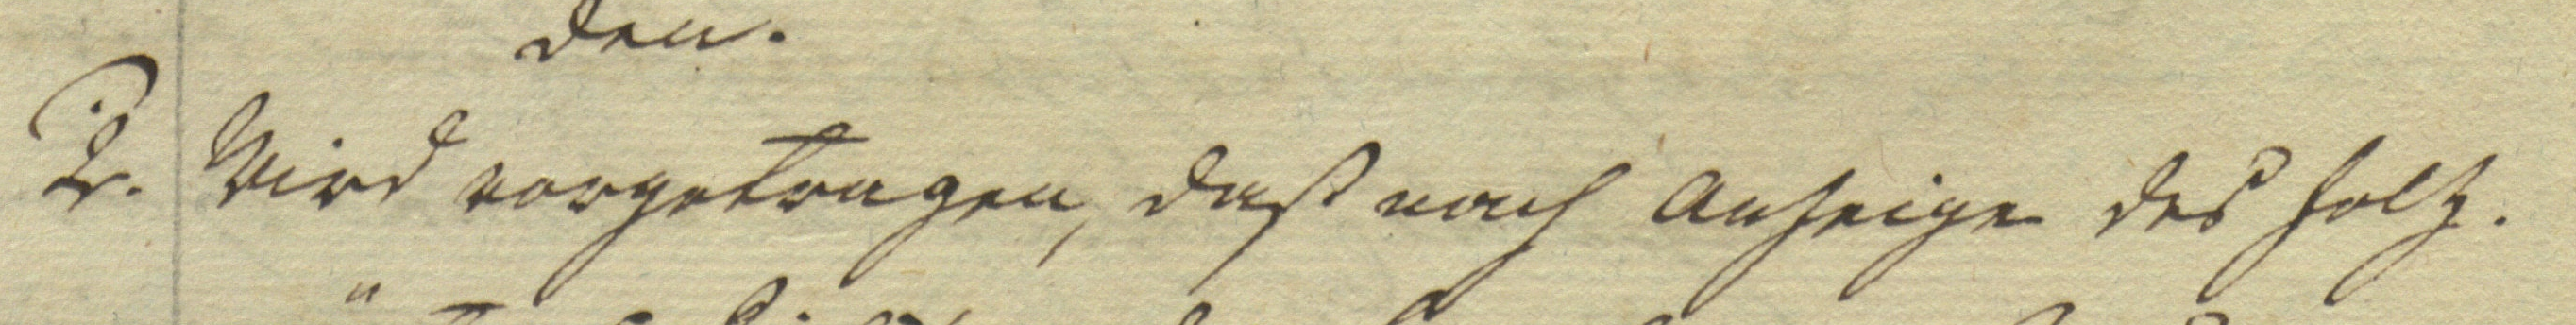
2. Wird vorgetragen, daß nach Anzeige des Holz¬
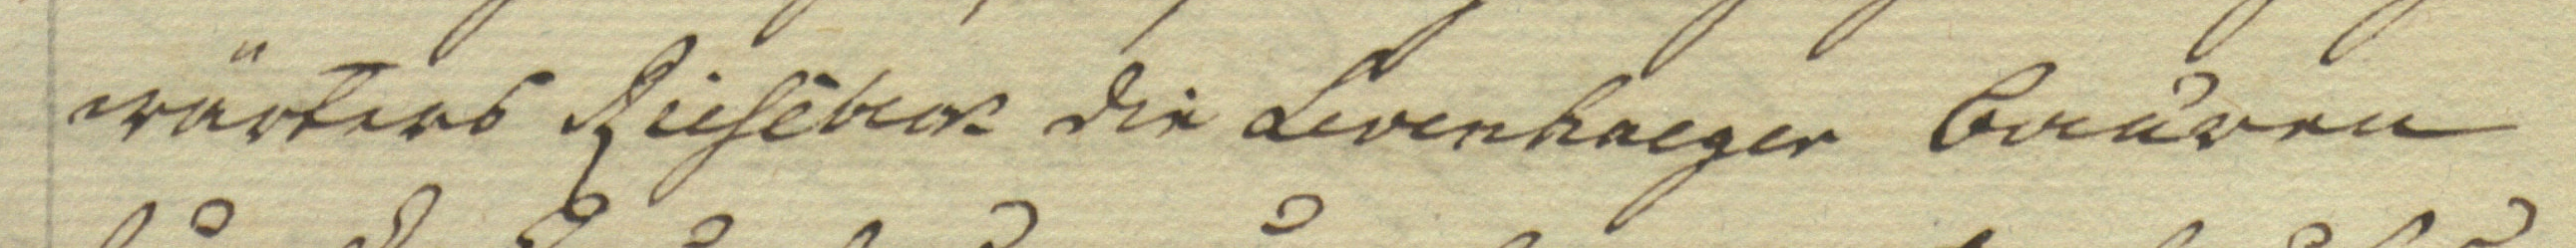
wärters Riesebeck die Levenhaeger Bauren
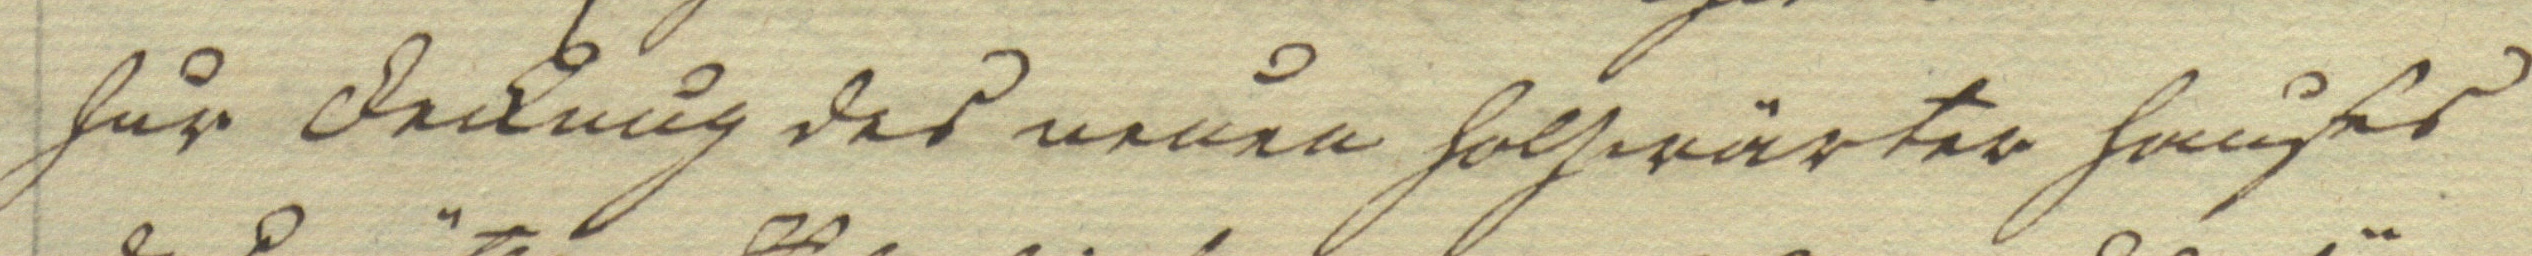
zur Deckung des neuen Holzwärter Hauses
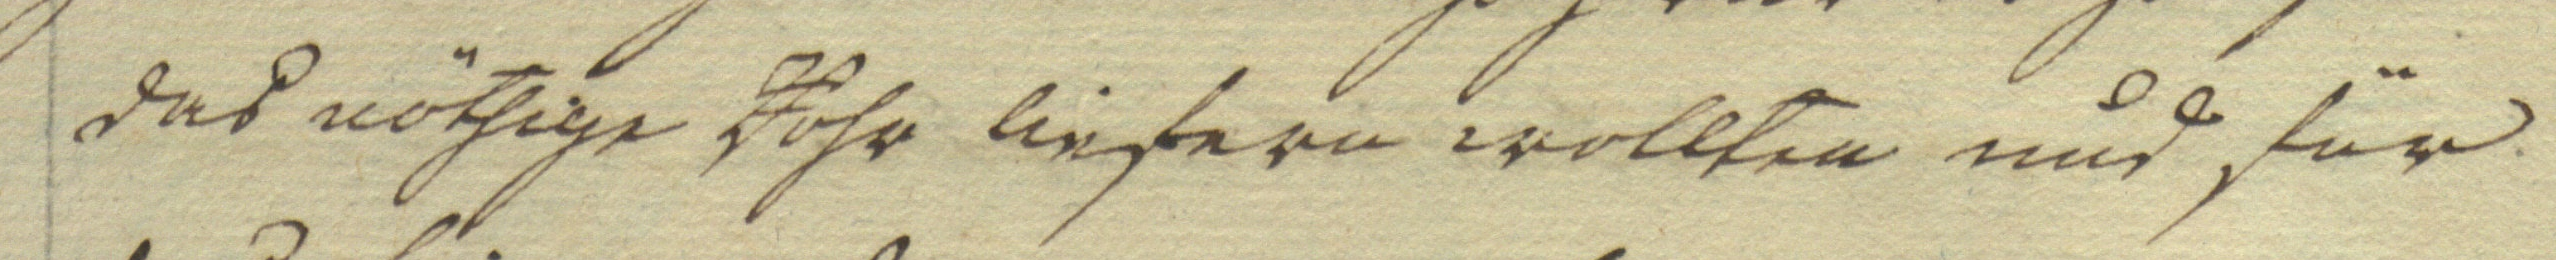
das nöthige Rohr liefern wollten und für
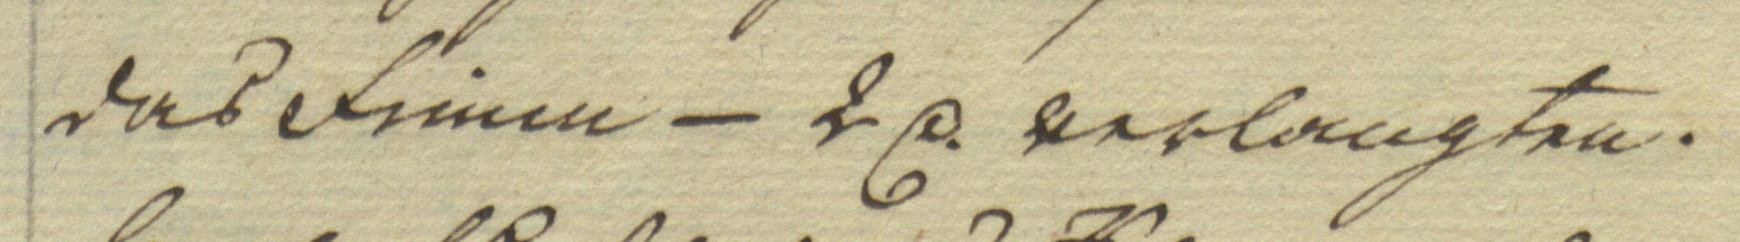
das Friem 2 l. verlangten.
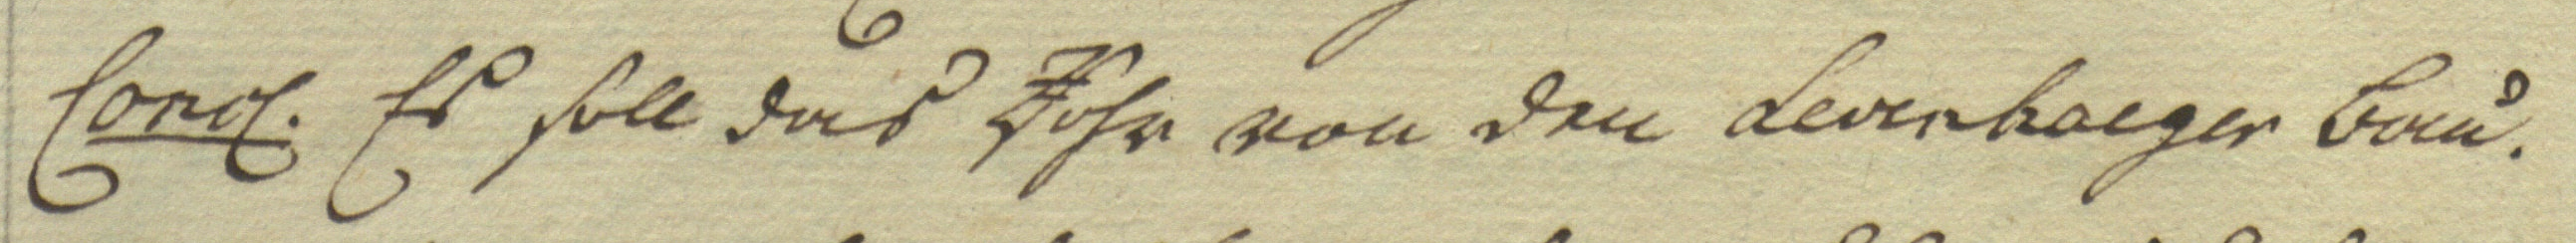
Concl. Es soll das Rohr von den Levenhaeger Bau¬
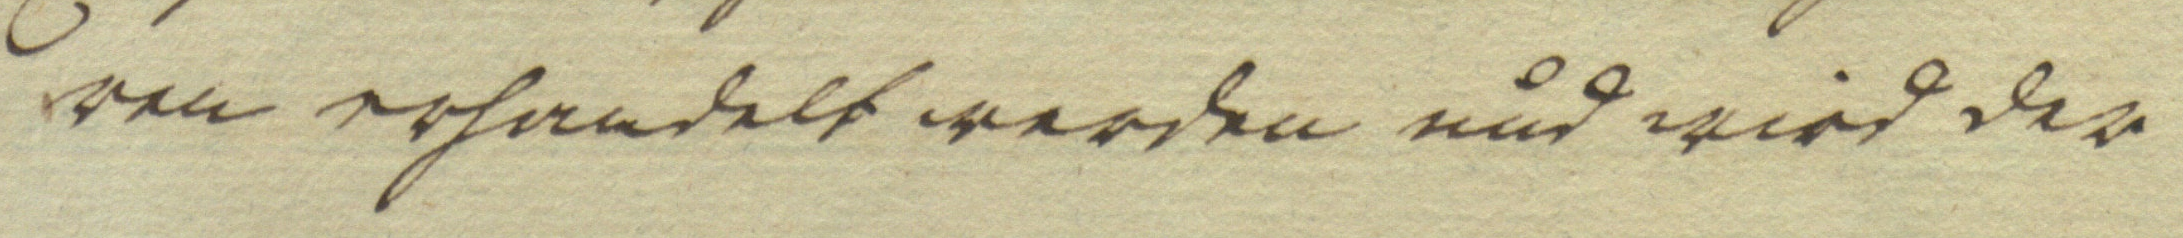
ren erhandelt werden und wird der
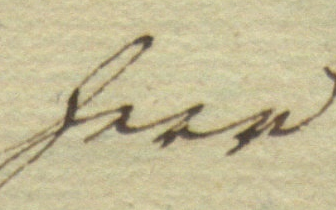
Herr
